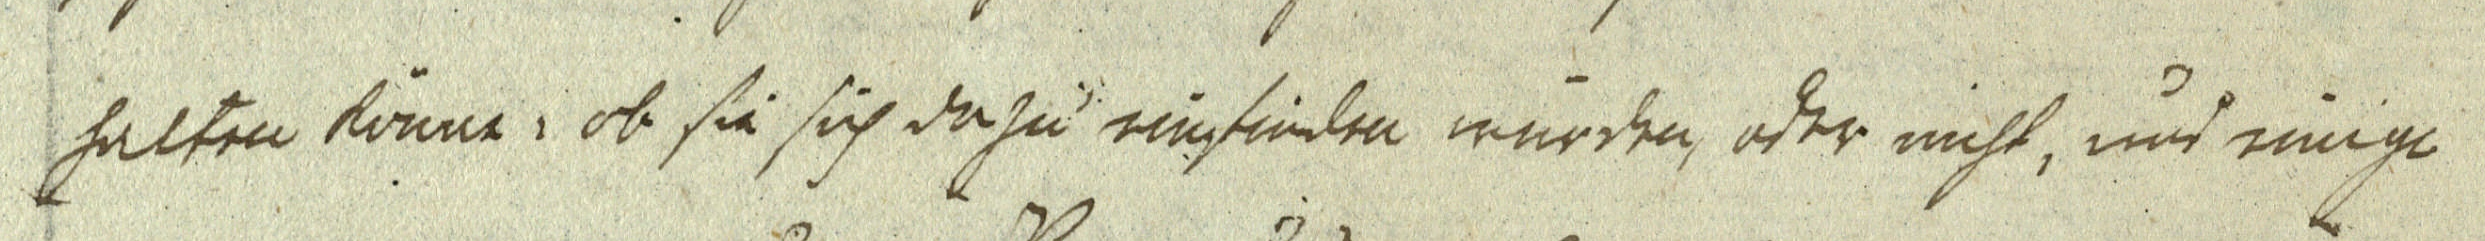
halten könne: ob sie sich da zu einfinden würden, oder nicht, und einige
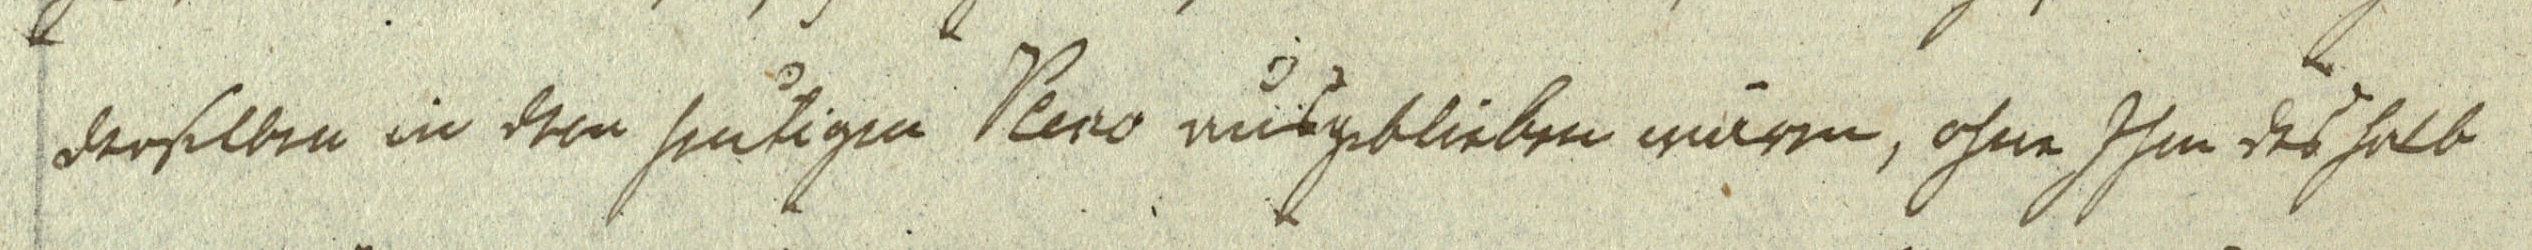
derselben in dem heutigen Pleno ausgeblieben wären, ohne Ihm deshalb
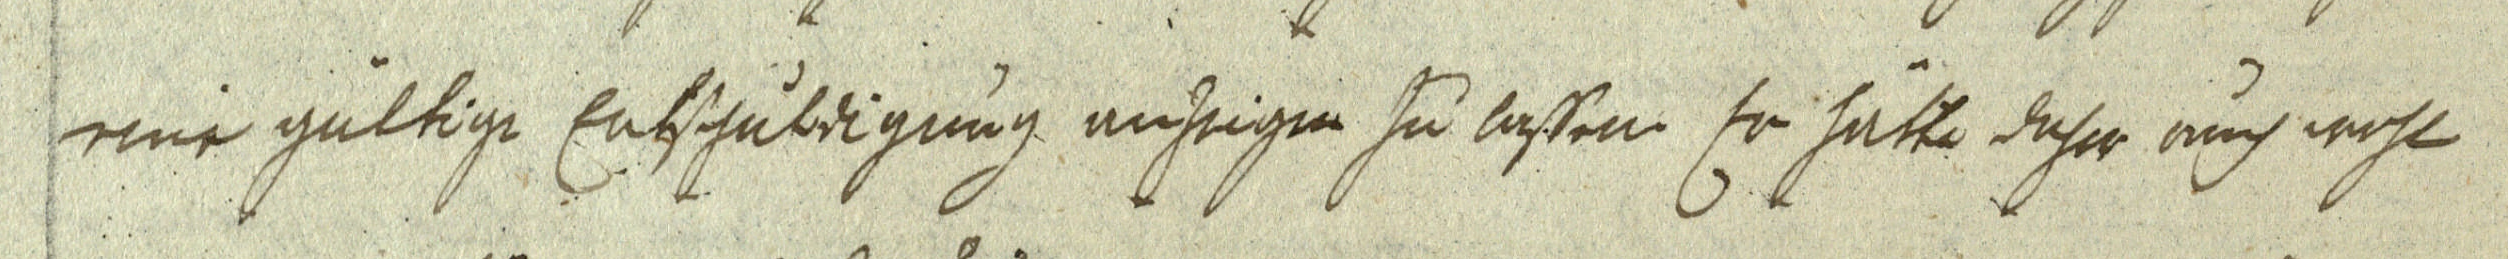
eine gültige Entschuldigung anzeigen zu lassen Er hätte daher auch wohl
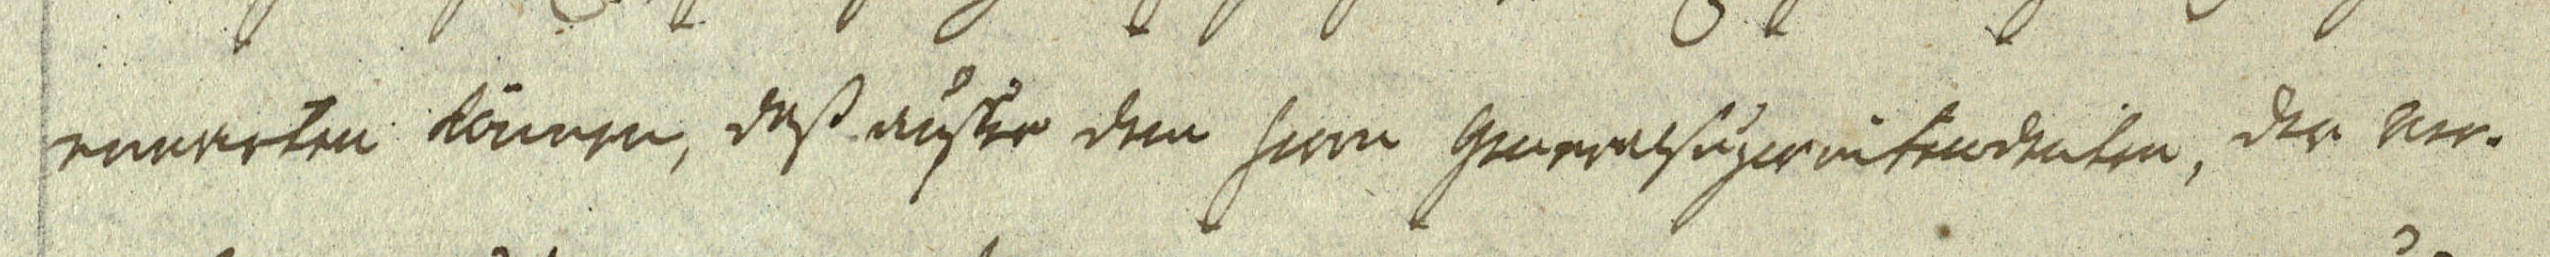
erwarten können, daß ausser dem Herrn Generalsuperintendenten, der ver¬
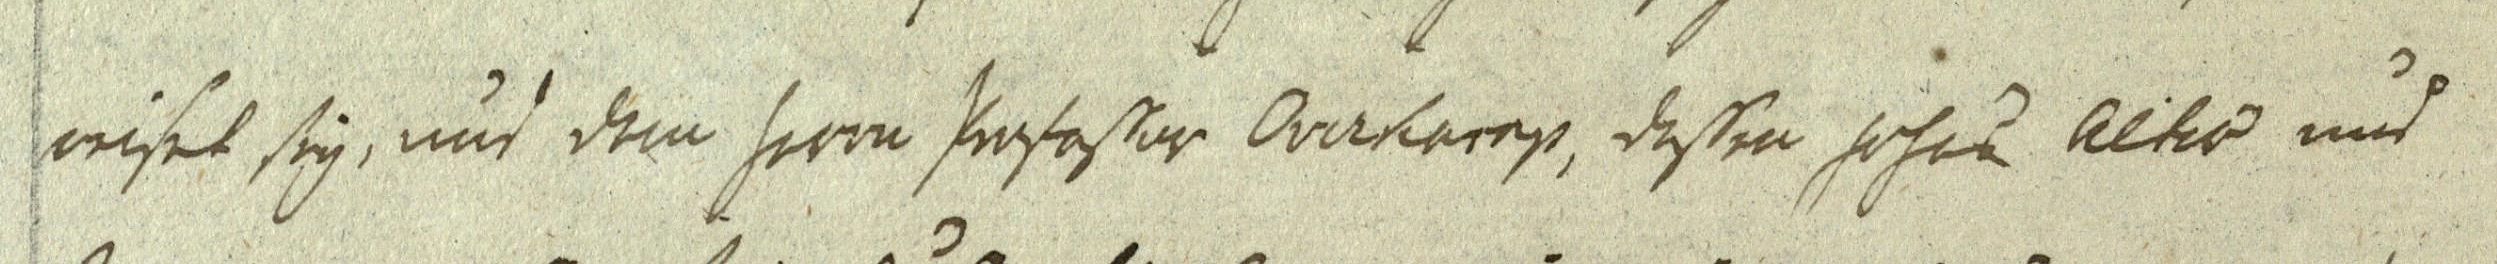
reiset seÿ, und dem Herrn Professor Overkamp, dessen hohes Alter und
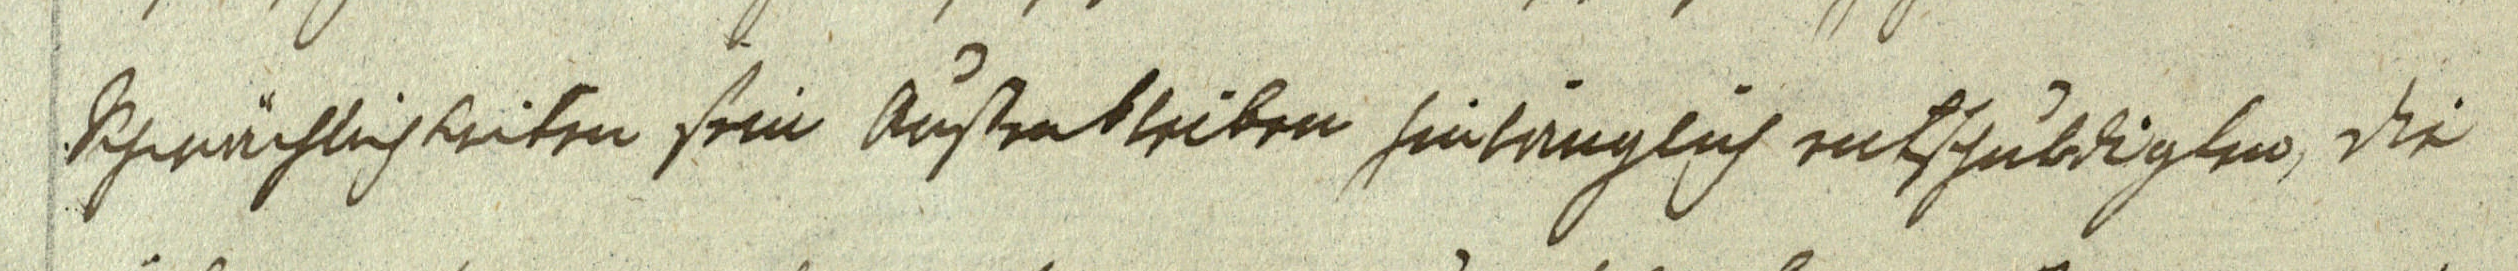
Schwächlichkeiten sein Außenbleiben hinlänglich entschuldigten, die
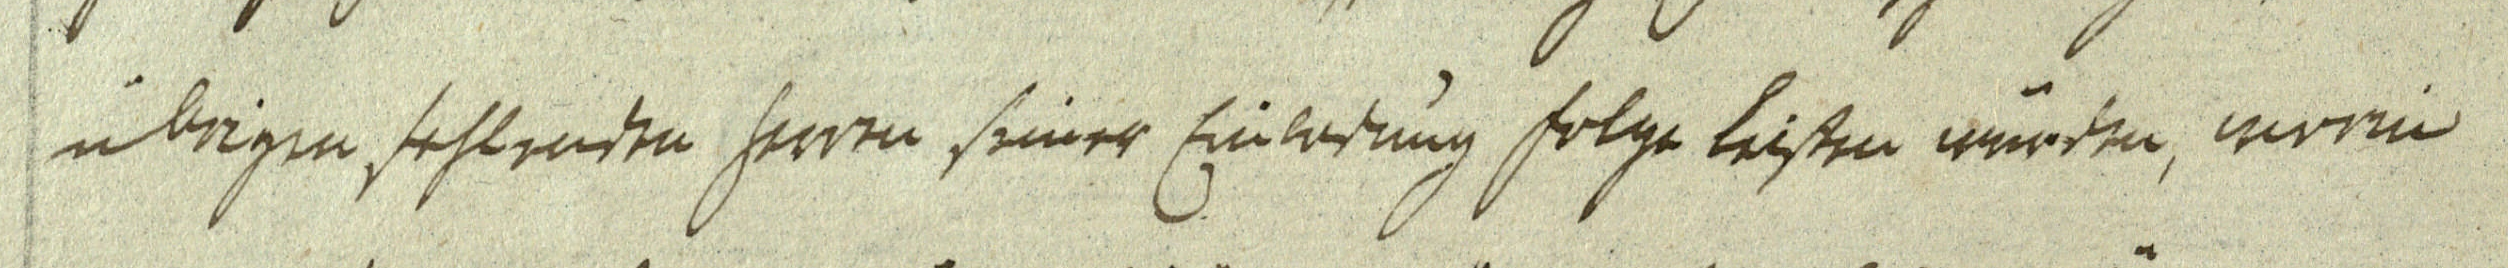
übrigen fehlenden Herren seiner Einladung Folge leisten würden, worin
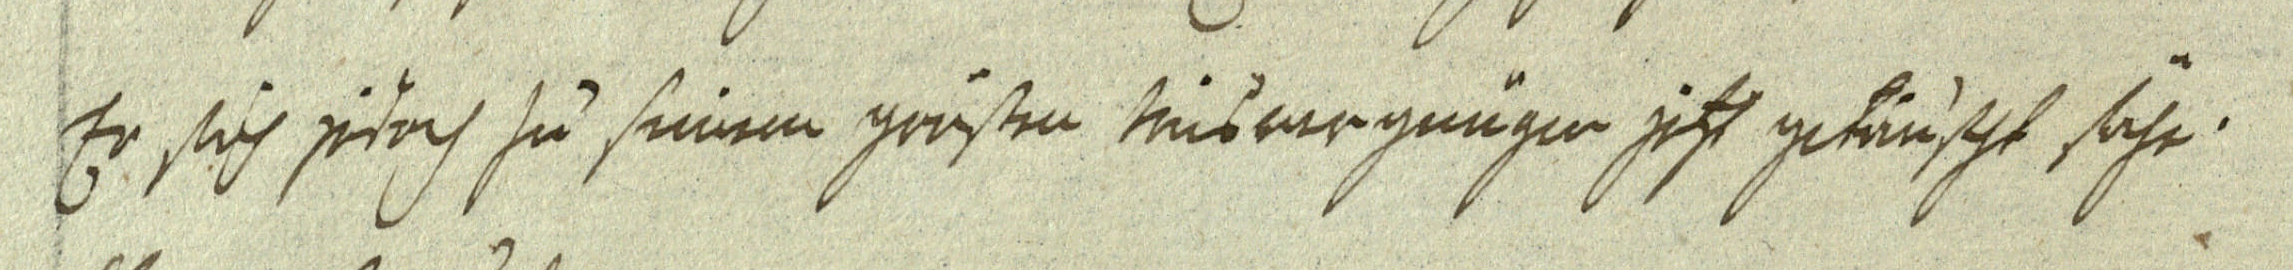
Er sich jedoch zu seinem grösten Misvergnügen jetzt getäuscht sähe.
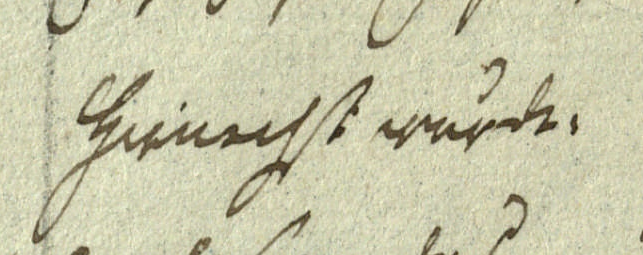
Hienechst würde.
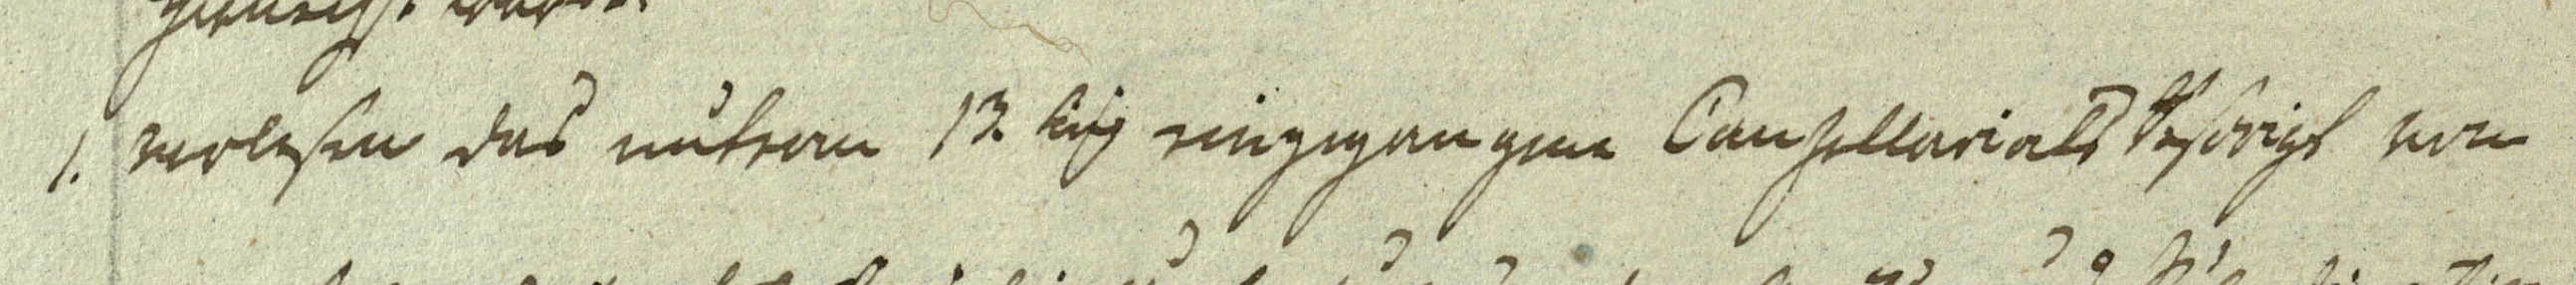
1. verlesen das unterm 13. huj eingegangene Canzellariats Rescript von
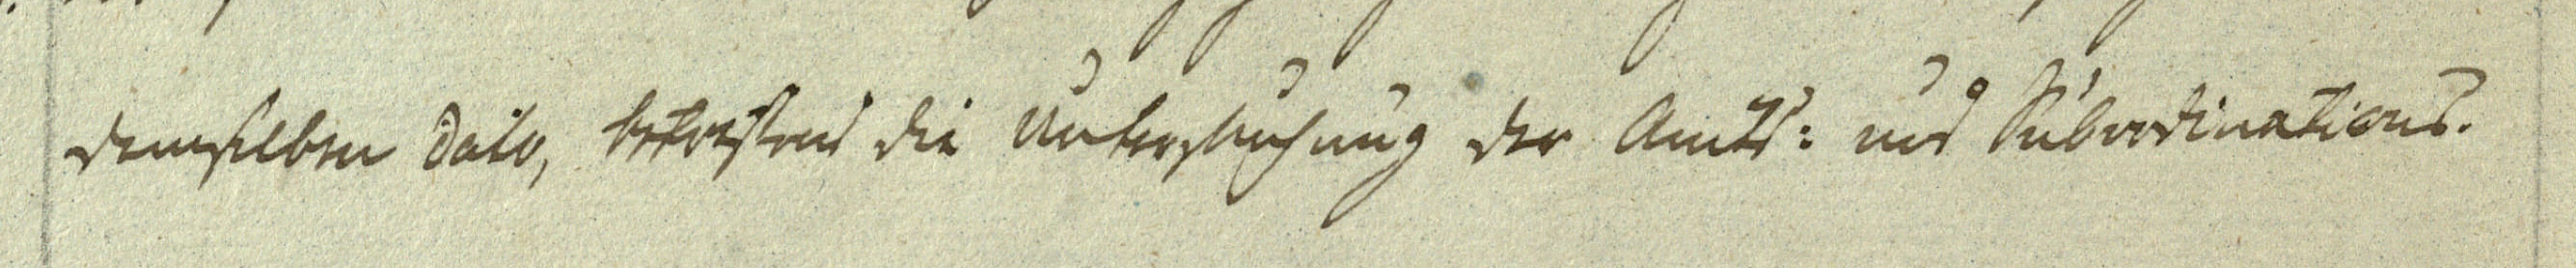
demselben dato, betreffend die Untersuchung der Amts: und Subordinations¬
